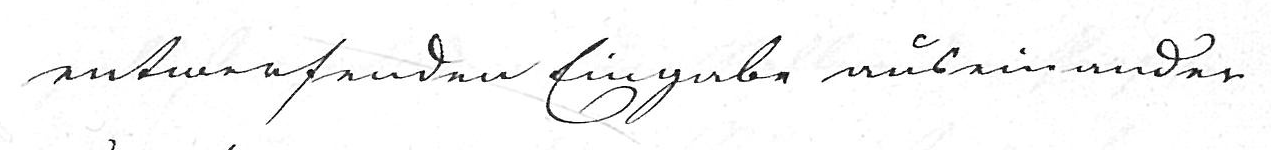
entwerfenden Eingabe auseinander
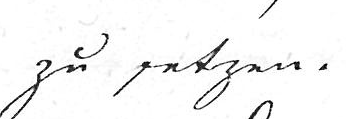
zu setzen.
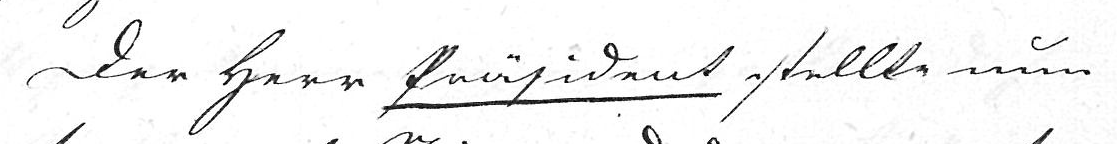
Der Herr Präsident stellte nun
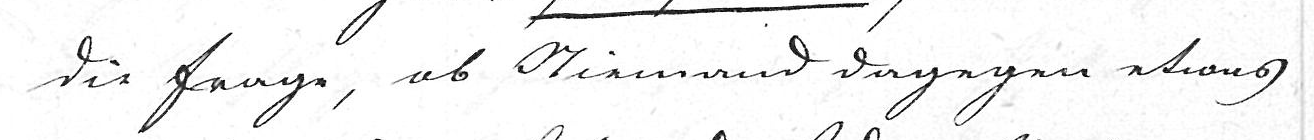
die Frage, ob Niemand dagegen etwas
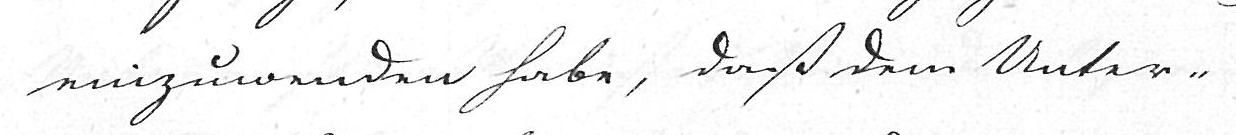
einzuwenden habe, daß dem Unter-
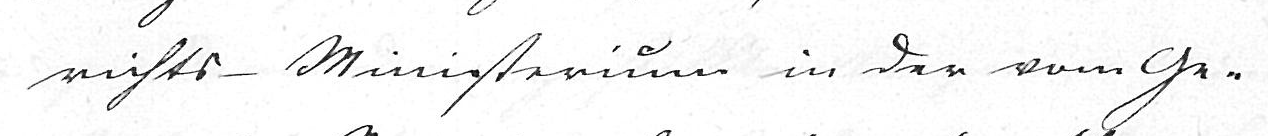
richts-Ministerium in der vom Ge-
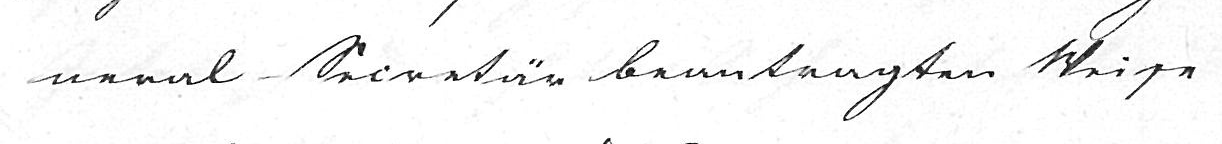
neral-Secretär beantragten Weise
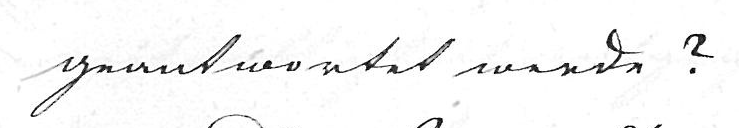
beantwortet werde?
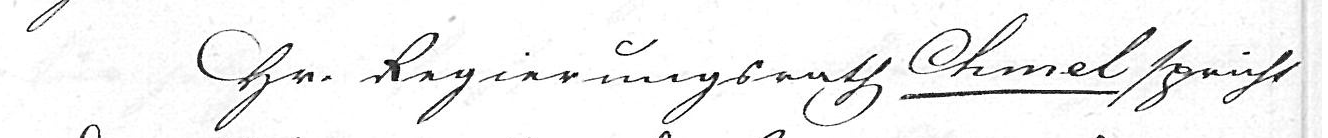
Hr. Regierungsrath Chmel spricht
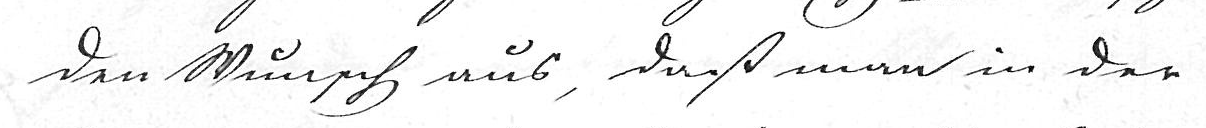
den Wunsch aus, daß man in der
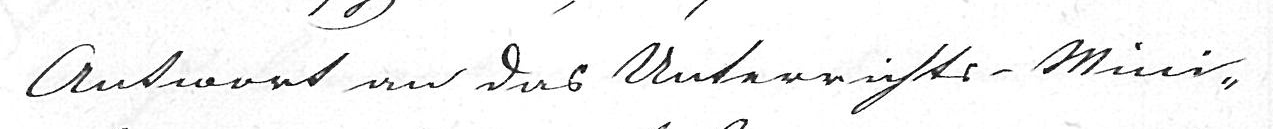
Antwort an das Unterrichts-Mini-
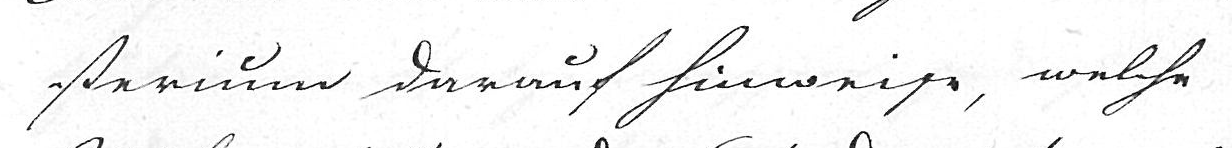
sterium darauf hinweis, welche
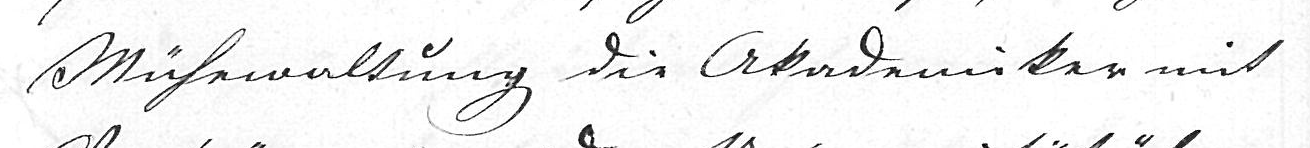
Mühewaltung die Akademiker mit
